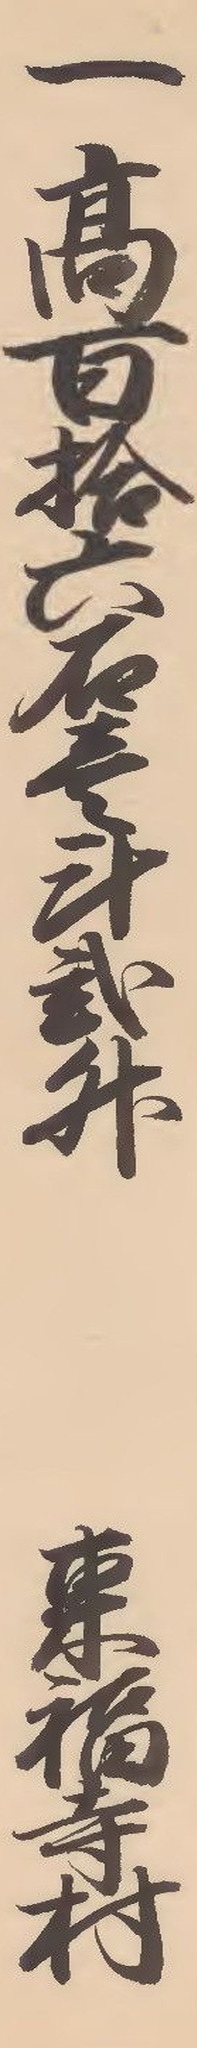一高百拾六石壱斗弐升東福寺村
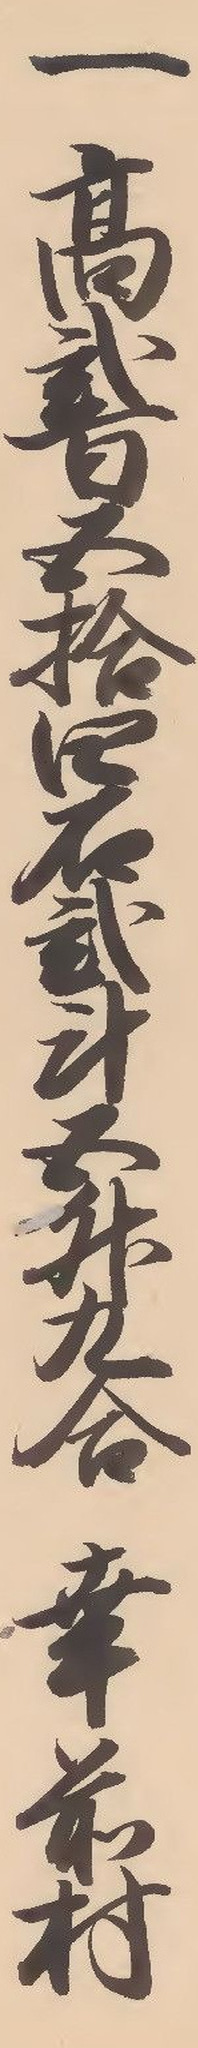一高弐百五拾四石弐斗五升九合幸前村
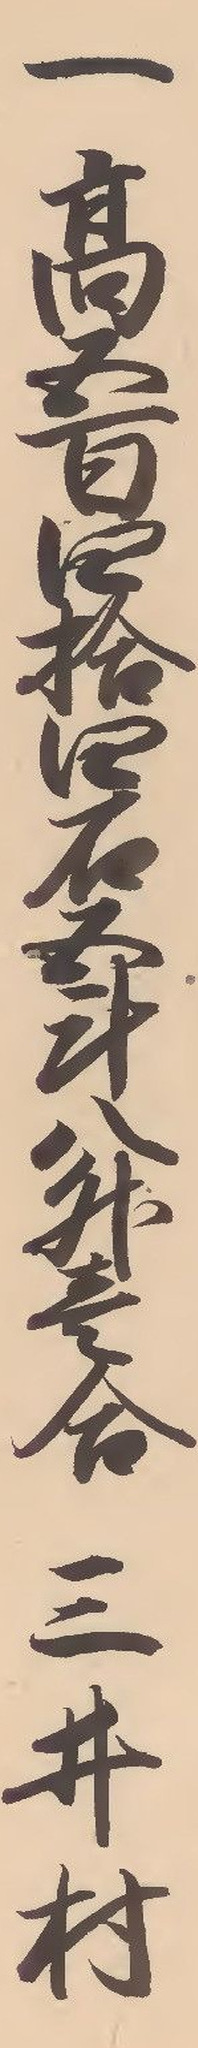一高五百四拾四石五斗八升壱合三井村

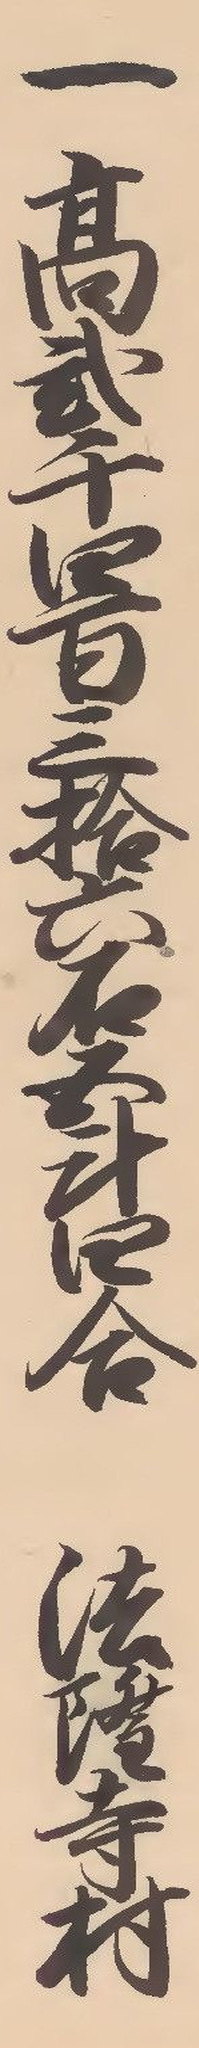一高弐千四百三拾六石五斗四合法隆寺村
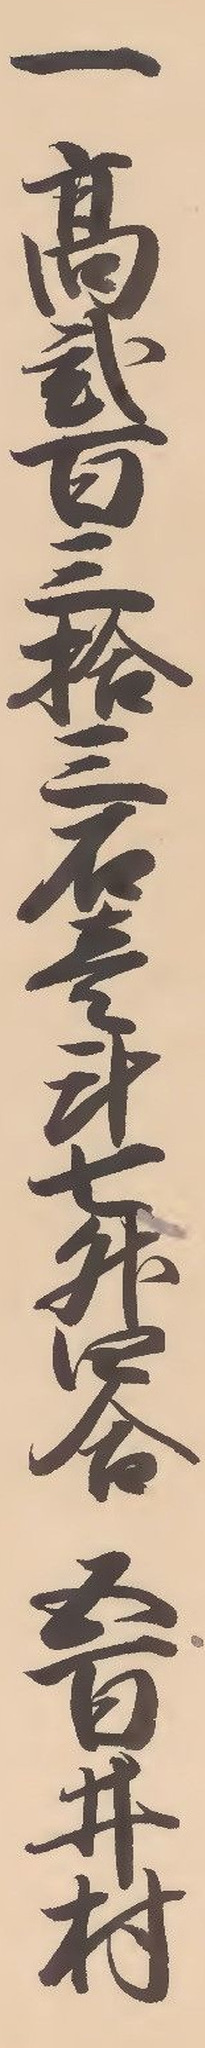一高弐百三拾三石壱斗七升四合五百井村
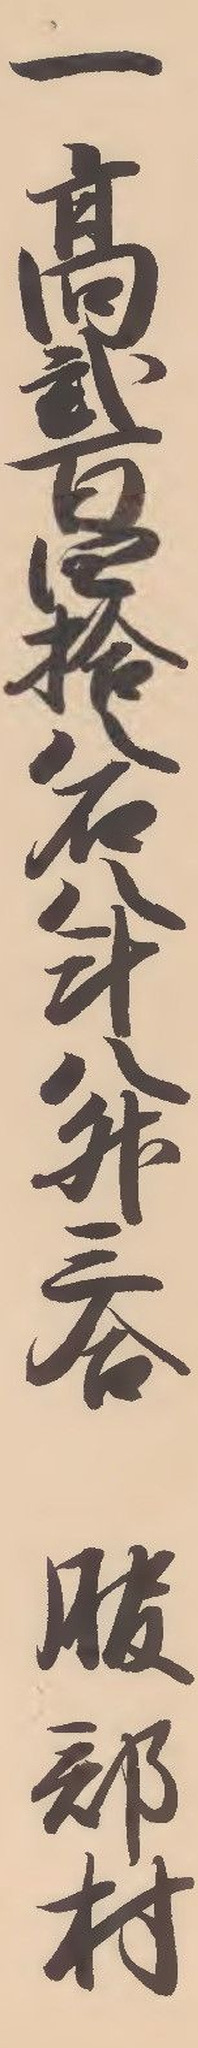一高弐百四拾八石八斗八升三合服部村
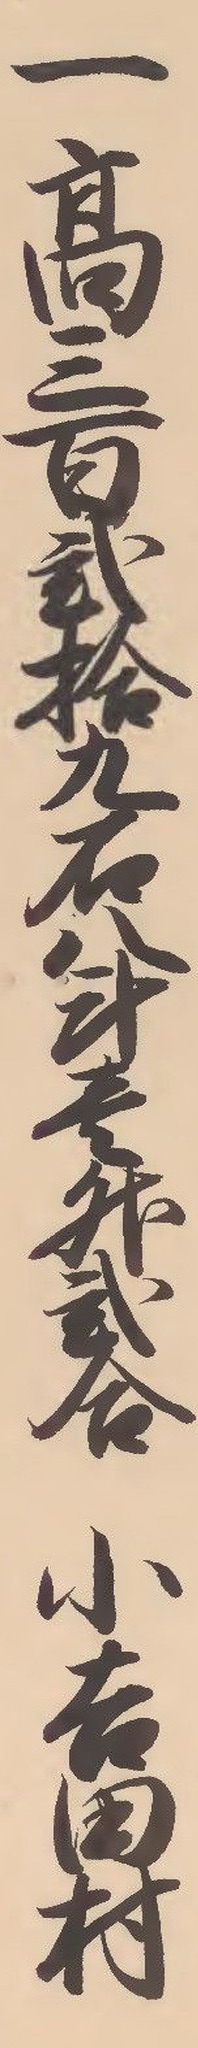一高三百弐拾九石八斗壱升弐合小吉田村
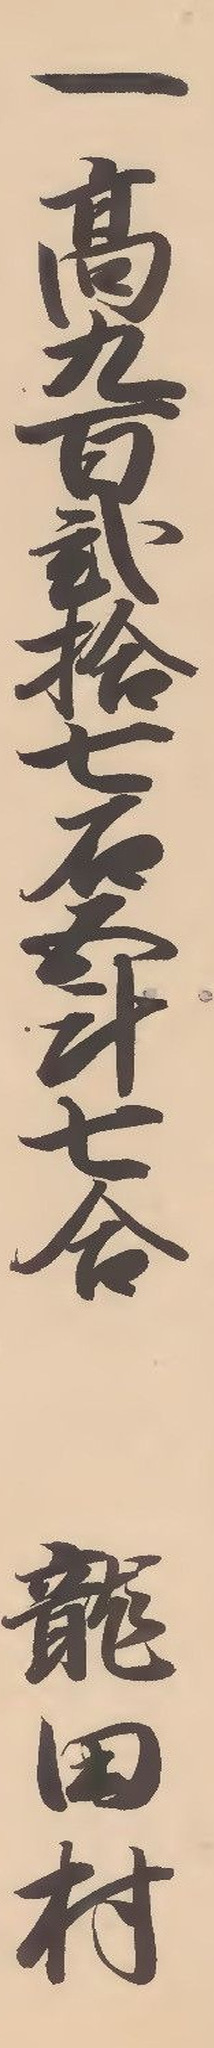一高九百弐拾七石五斗七合龍田村
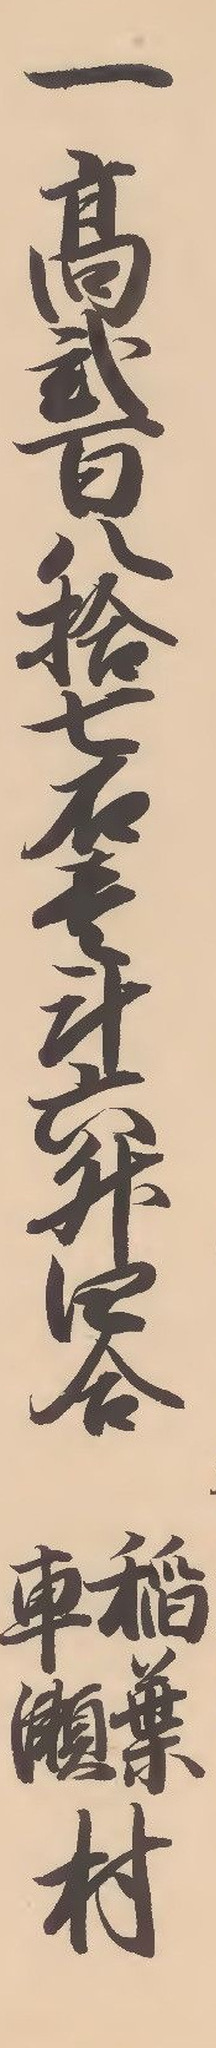一高弐百三拾三石壱斗七升四合五百井村
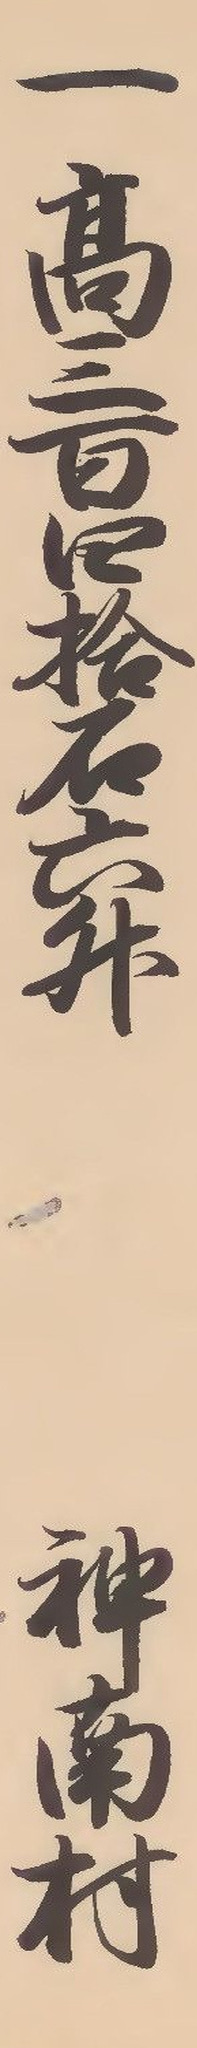一高三百四拾石六升神南村
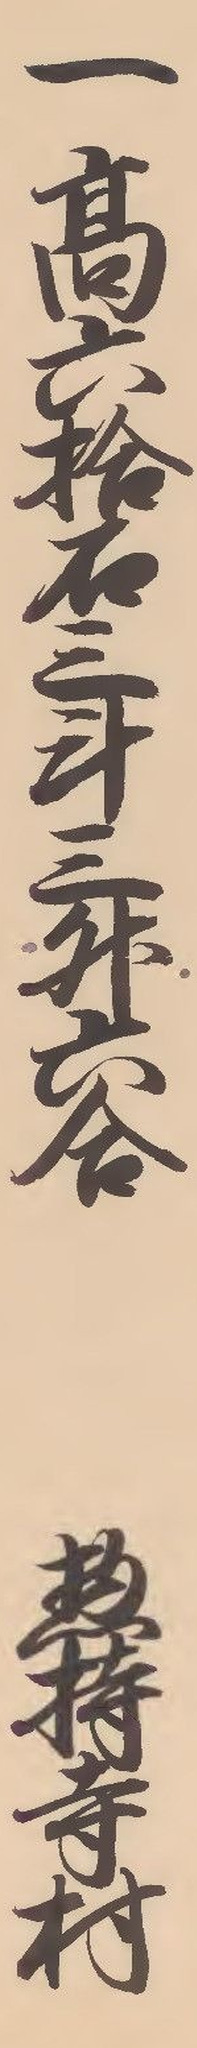一高六拾石三斗三升六合惣持寺村

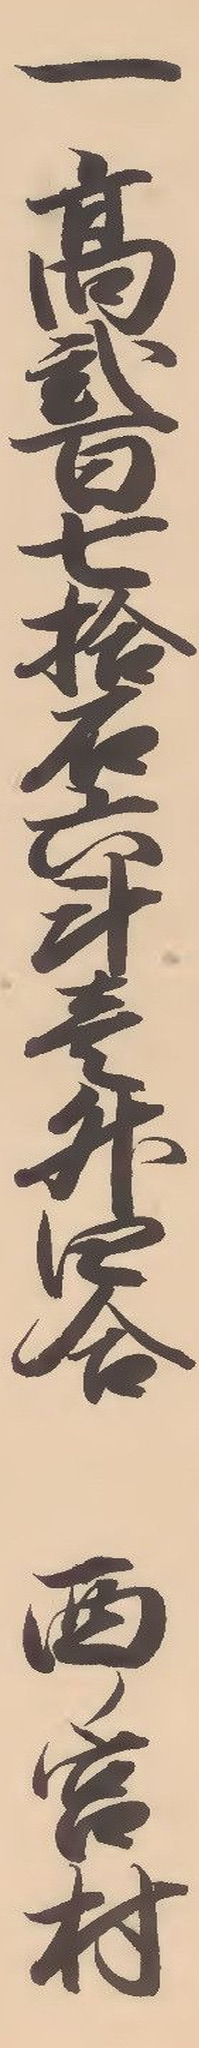一高弐百七拾石六斗壱升四合西ノ宮村
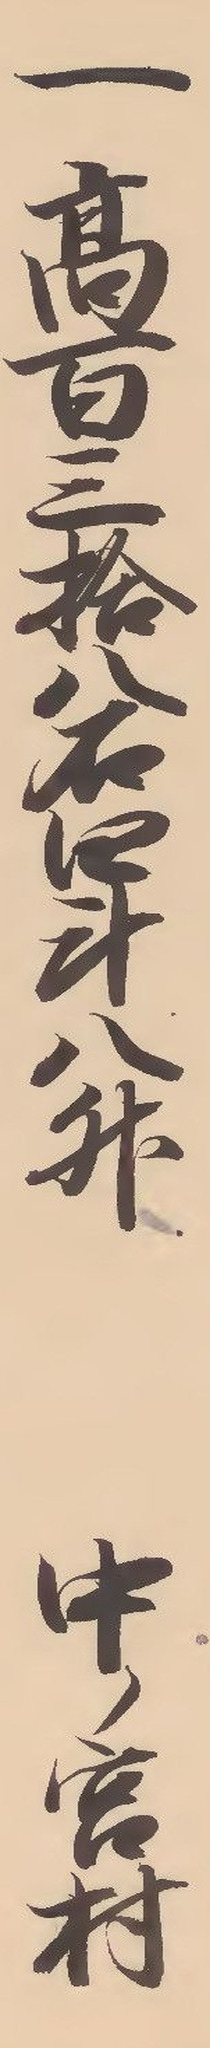一高百三拾八石四斗八升中ノ宮村
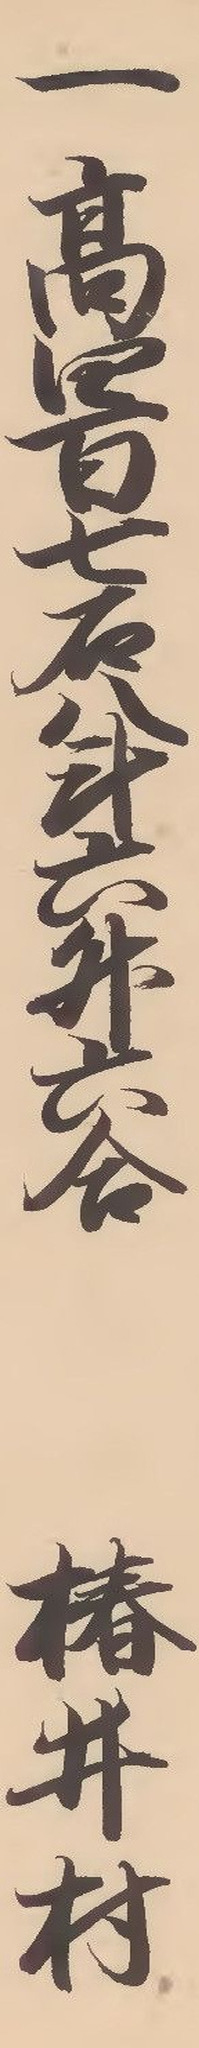一高四百七石八斗六升六合椿井村
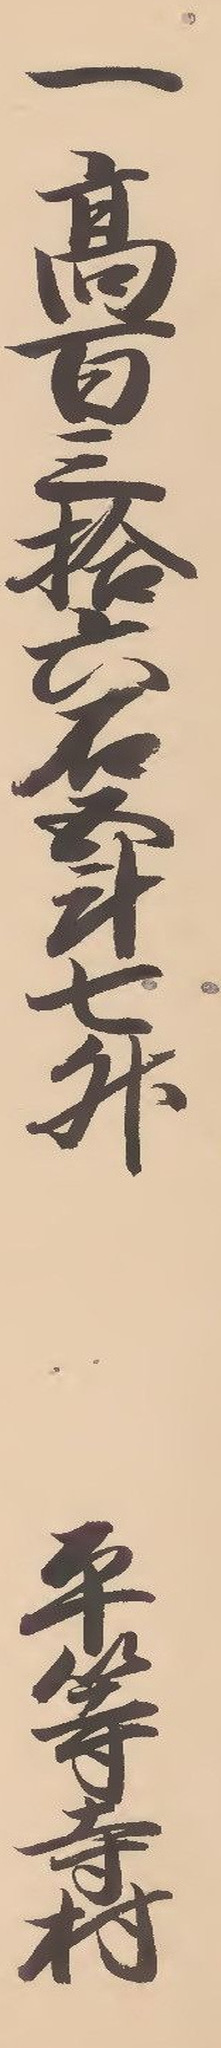一高百三拾六石五斗七升平等寺村
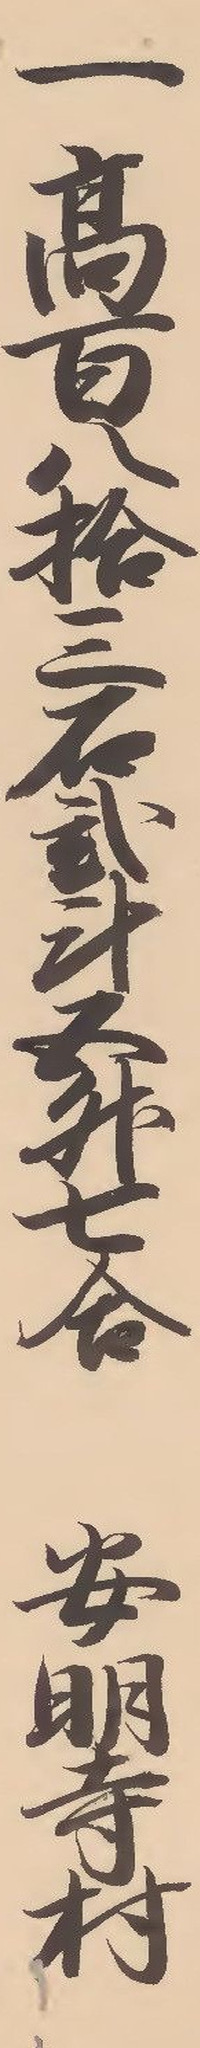一高百八拾三石弐斗五升七合安明寺村
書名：大和国郷帳
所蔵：国立公文書館 National Archives of Japan
